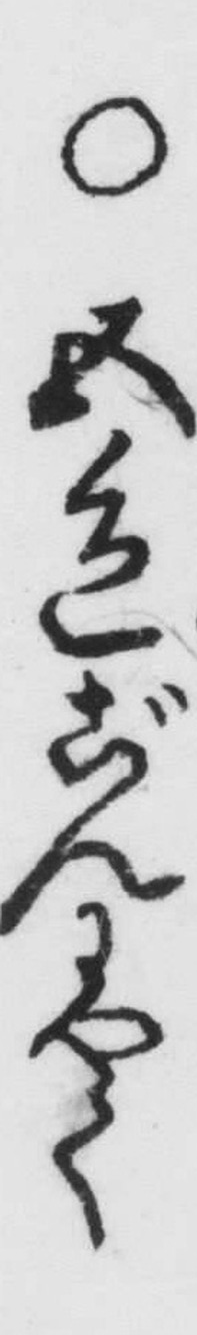○五色ごんにやく
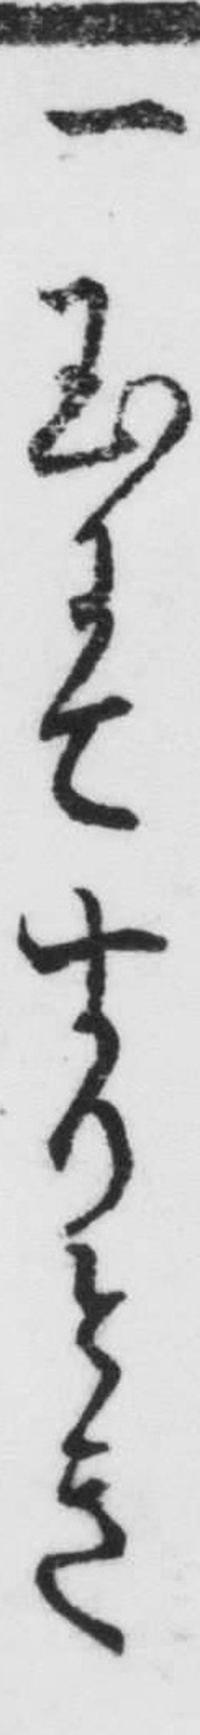一玉にてすりとき
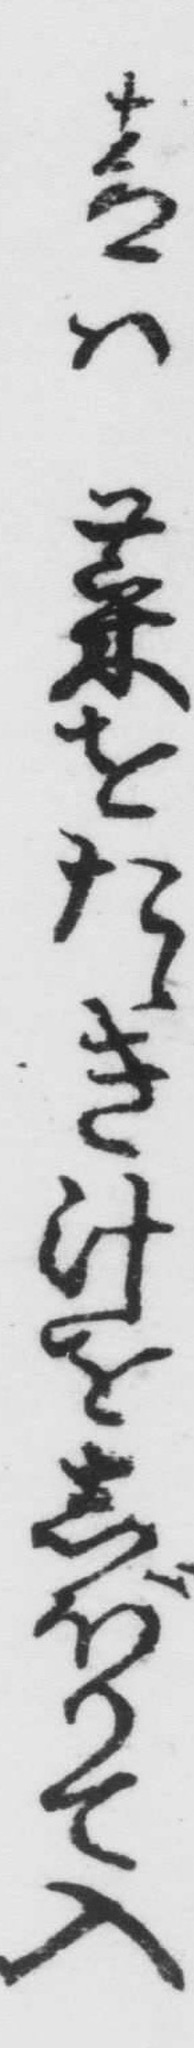青は葉をたゝき汁をしぼりて入
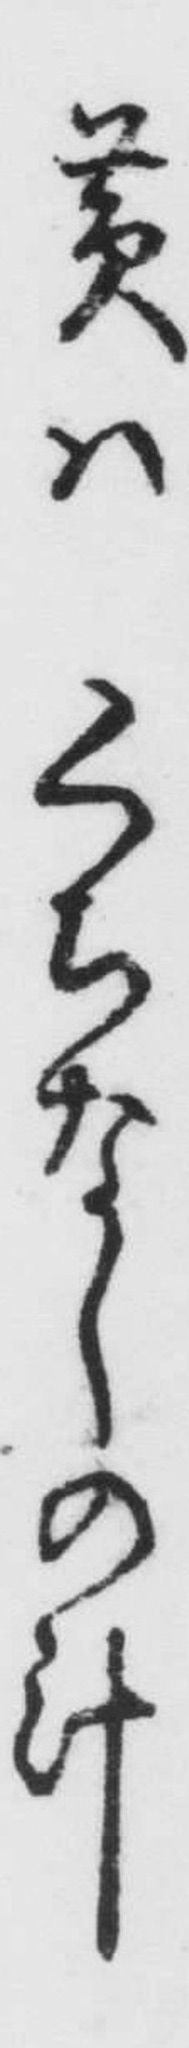黄はくちなしの汁
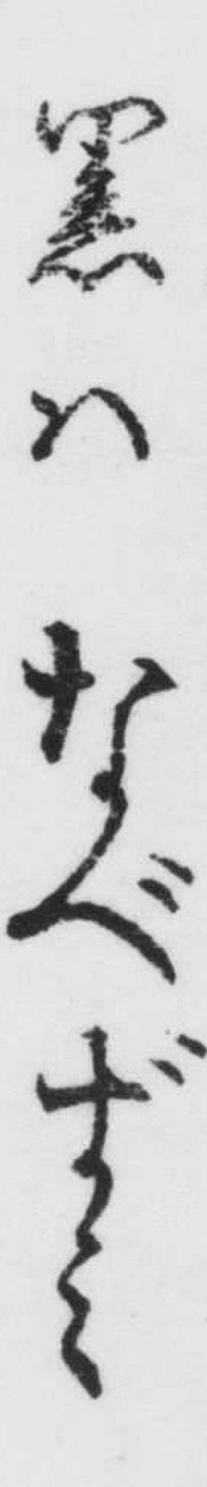黒はなべずみ
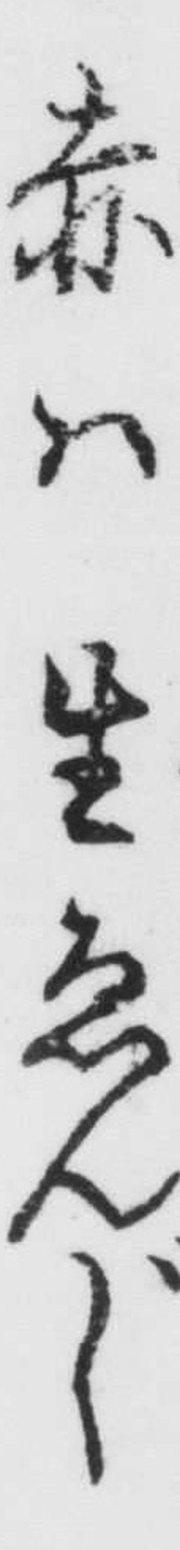赤は生ゑんじ
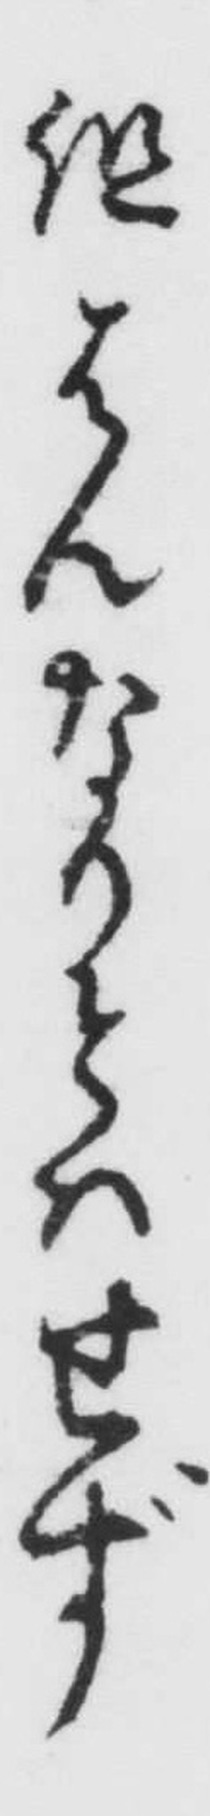但はんなりとはせず
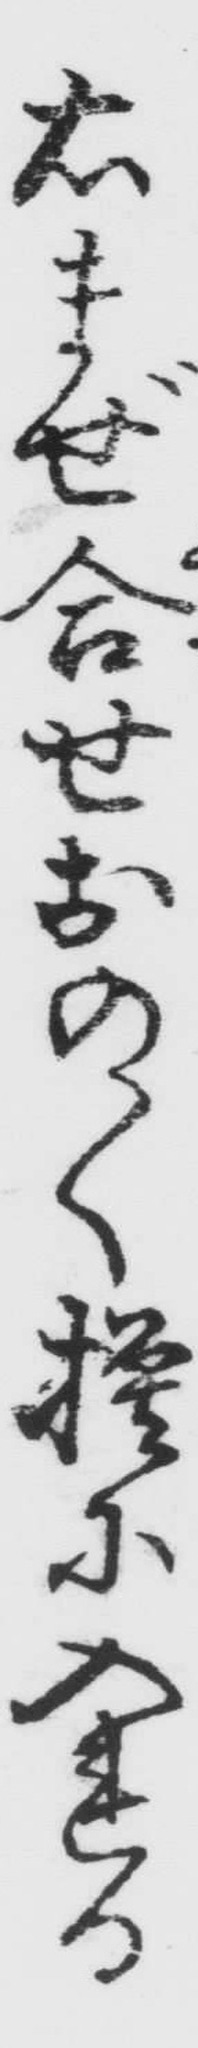右まぜ合せおの〳〵模に入れる
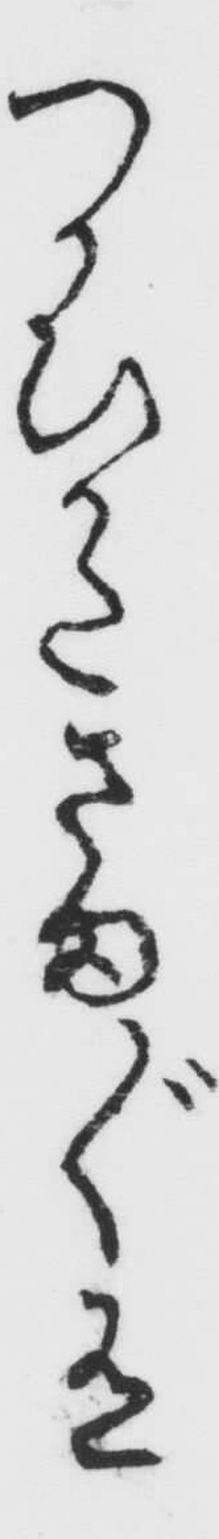つかひかたさま〴〵有
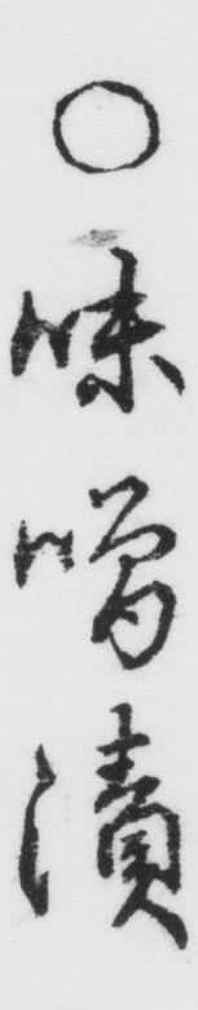○味噌漬
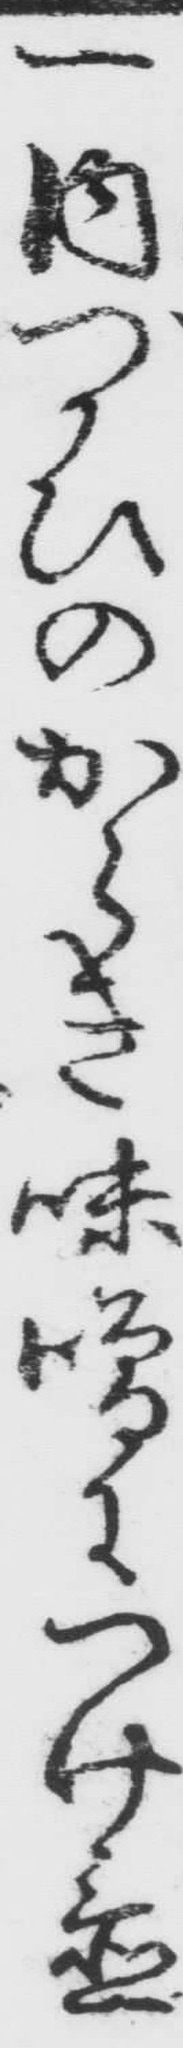一内づかひのからき味噌につけ置
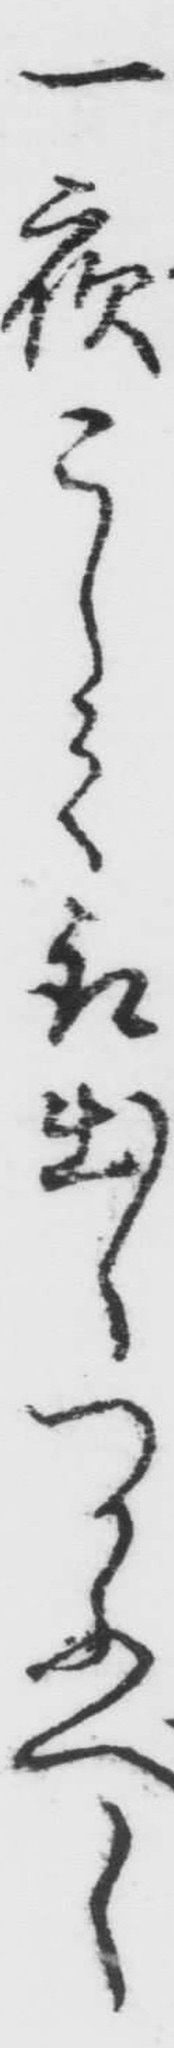一夜こしみ取出しつかふべし
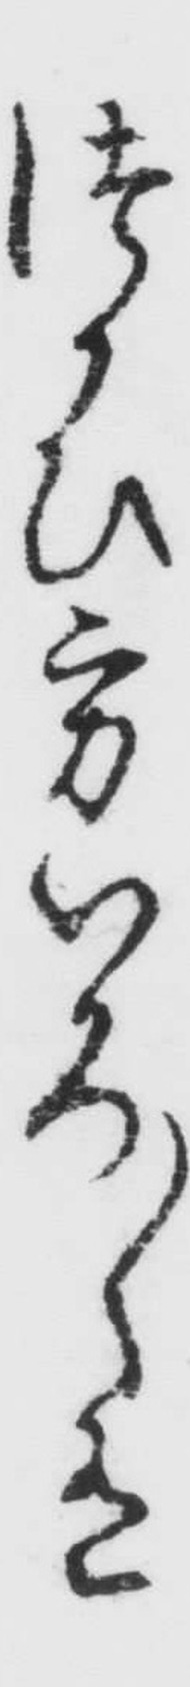つかひ方いろ〳〵有

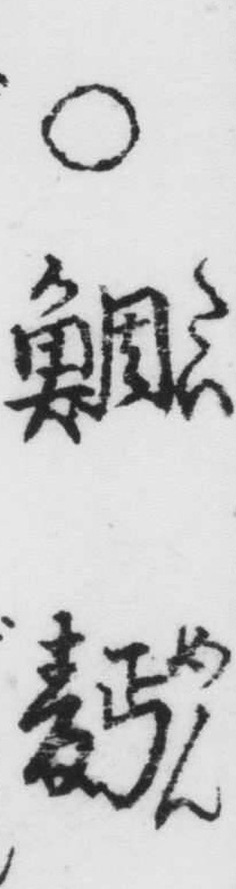○鯛麺
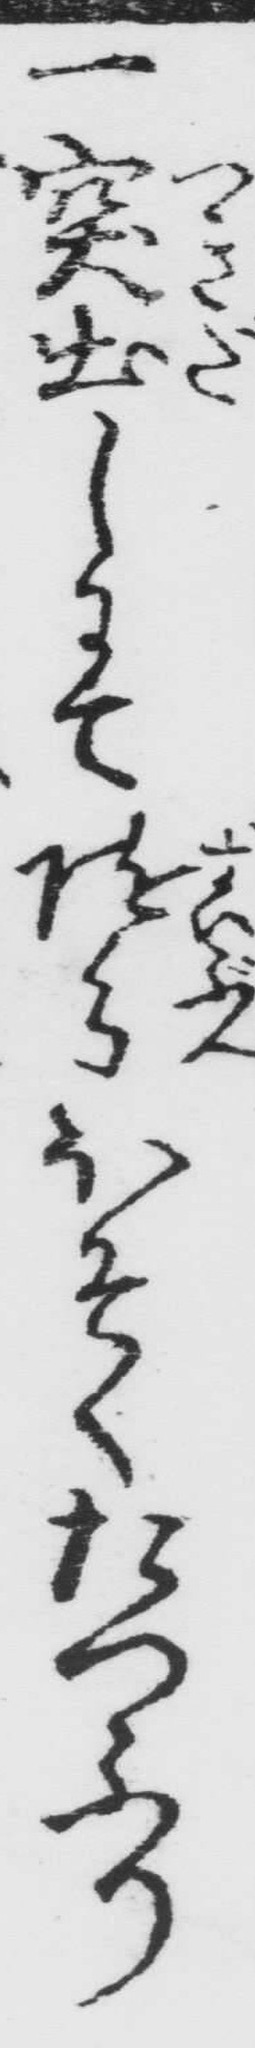一突出しにて随分ほそくたつふり
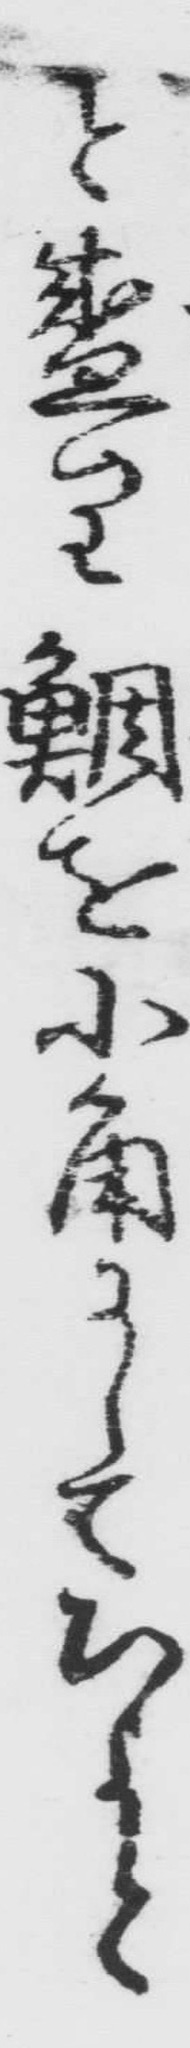と盛り鯛を小角にしてちよと
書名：蒟蒻百珍
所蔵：大阪府立大学学術情報センター 国文学研究資料館
